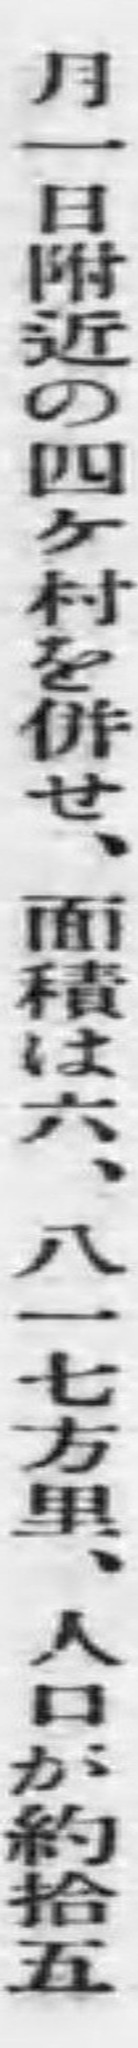月一日附近の四ヶ村を併せ、面積は六、八一七方里、人口が約拾五
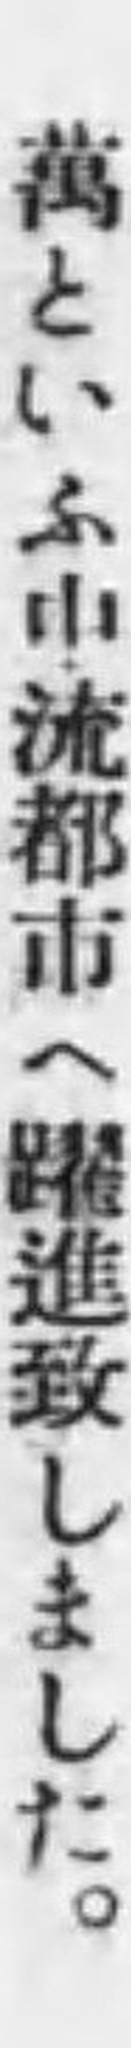萬といふ中流都市へ躍進致しました。
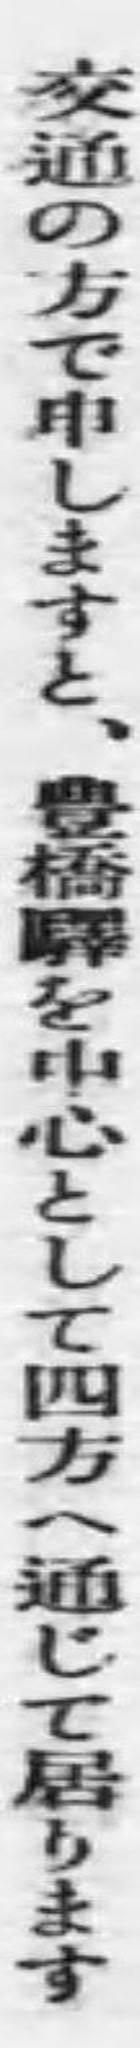交通の方で申しますと、豊橋驛を中心として四方へ通じて居ります

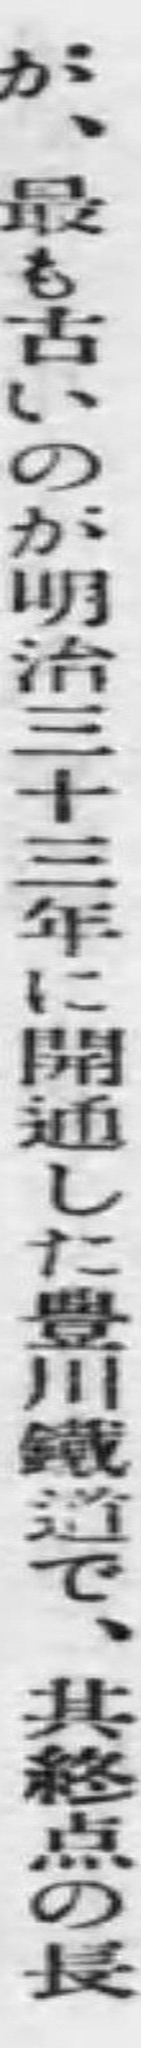が、最も古いのが明治三十三年に開通した豊川鐵道で、其終点の長
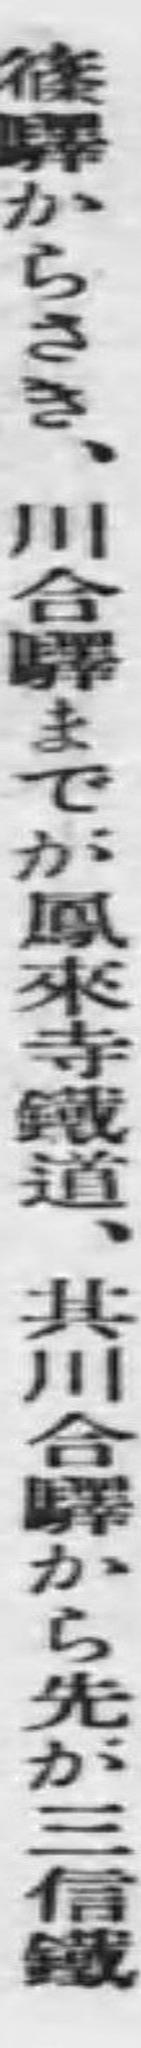篠驛からさき、川合驛までが鳳來寺鐵道、其川合驛から先が三信鐵
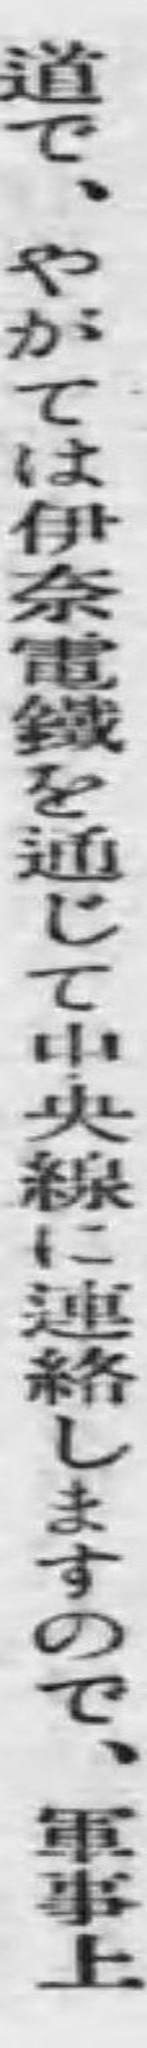道で、やがては伊奈電鐵を通じて中央線に連結しますので、軍事上
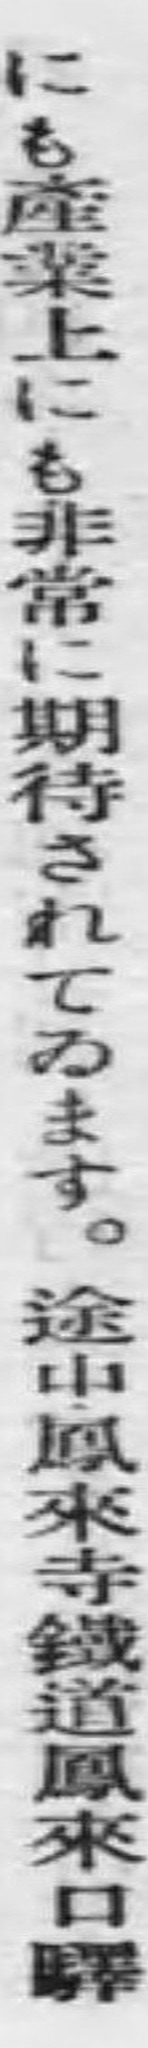にも産業上にも非常に期待されてゐます。途中鳳來寺鐵道鳳來口驛
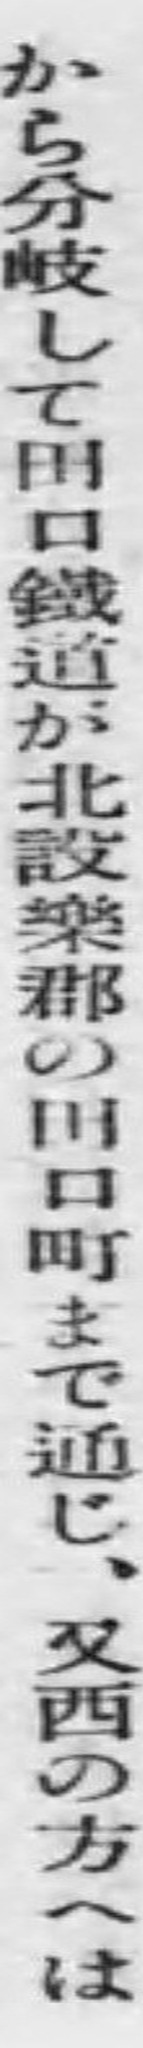から分岐して田口鐵道が北設楽郡の田口町まで通じ、又西の方へは
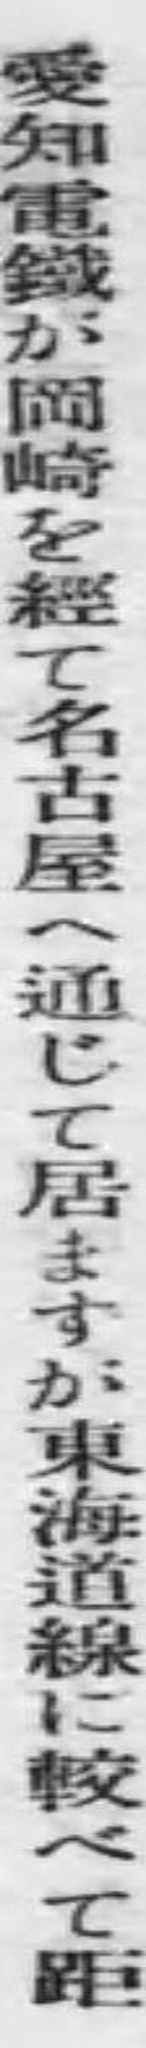愛知電鐵が岡崎を経て名古屋へ通じて居ますが東海道線に較べて距
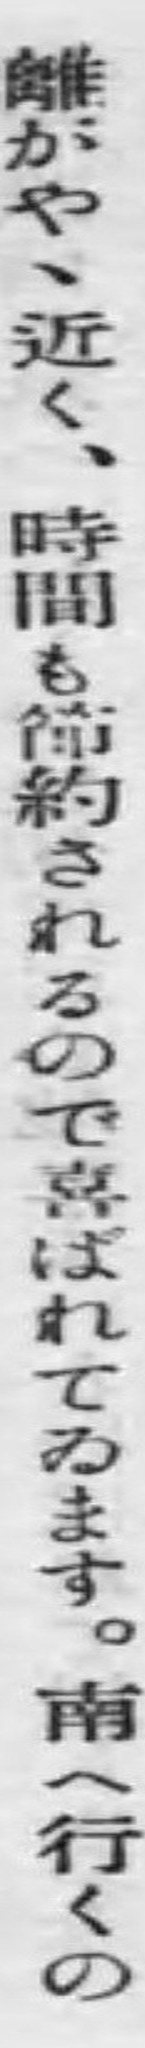離がやヽ近く、時間も節約されるので喜ばれてゐます。南へ行くの
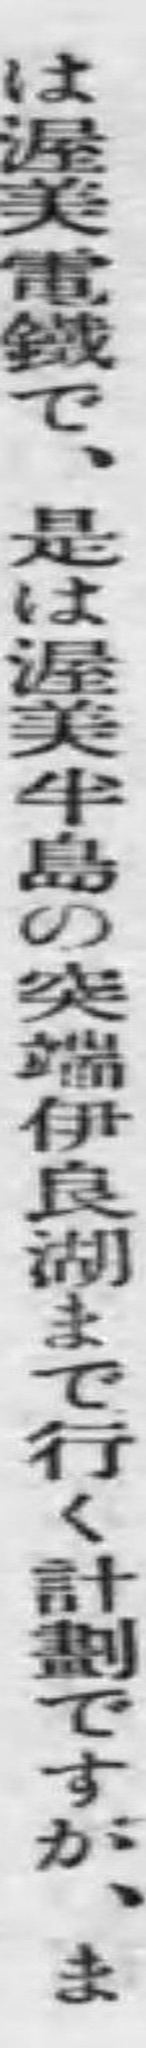は渥美電鐵で、是は渥美半島の突端伊良湖まで行く計劃ですが、ま
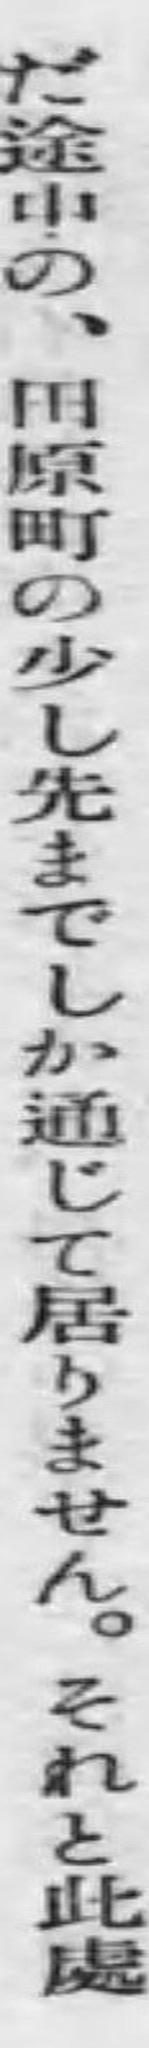だ途中の、田原町の少し先までしか通じて居りません。それと此處
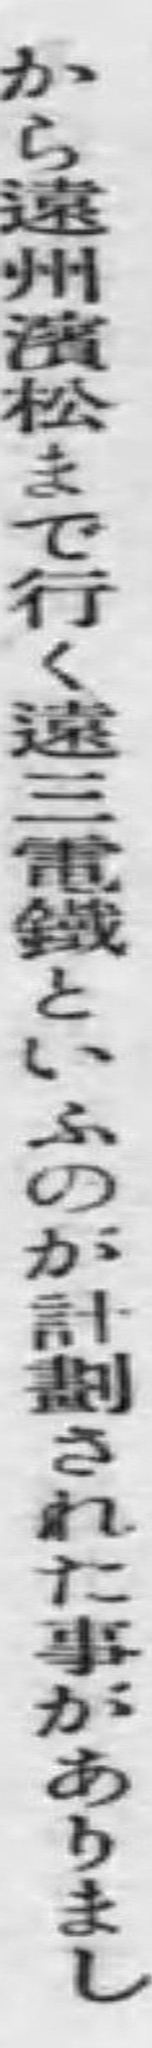から遠州濱松まで行く遠三電鐵といふのが計劃された事がありまし
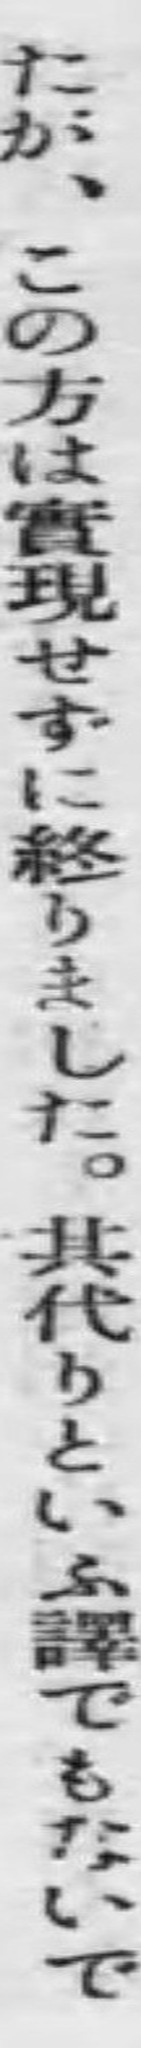たが、この方は實現せずに終りました。其代りといふ譯でもないで
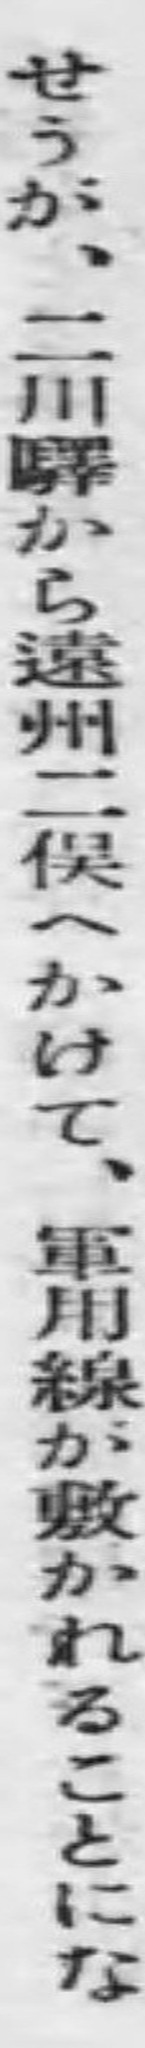せうが、二川驛から遠州二俣へかけて、軍用線が敷かれることにな
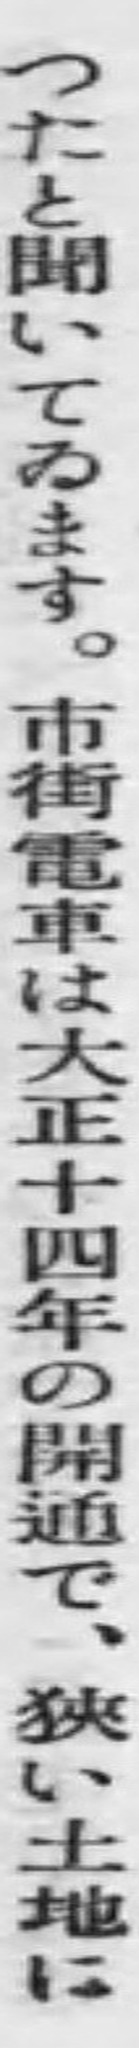つたと聞いてゐます。市街電車は大正十四年の開通で、狭い土地に
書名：東三河道中記 : 豊橋市及其附近案内
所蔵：国立国会図書館 National Diet Library, JAPAN
